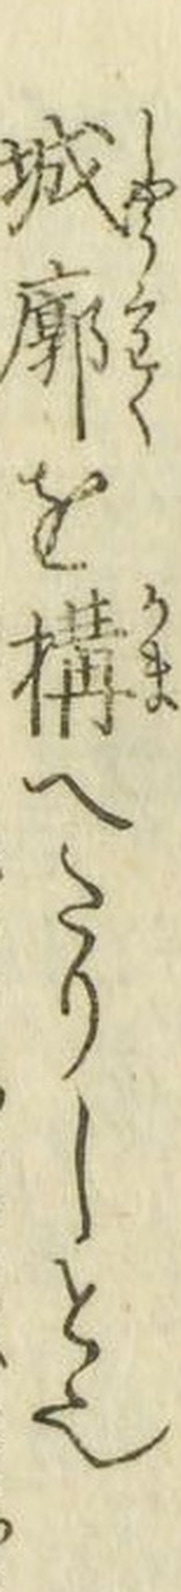城廓を搆へたりしと也
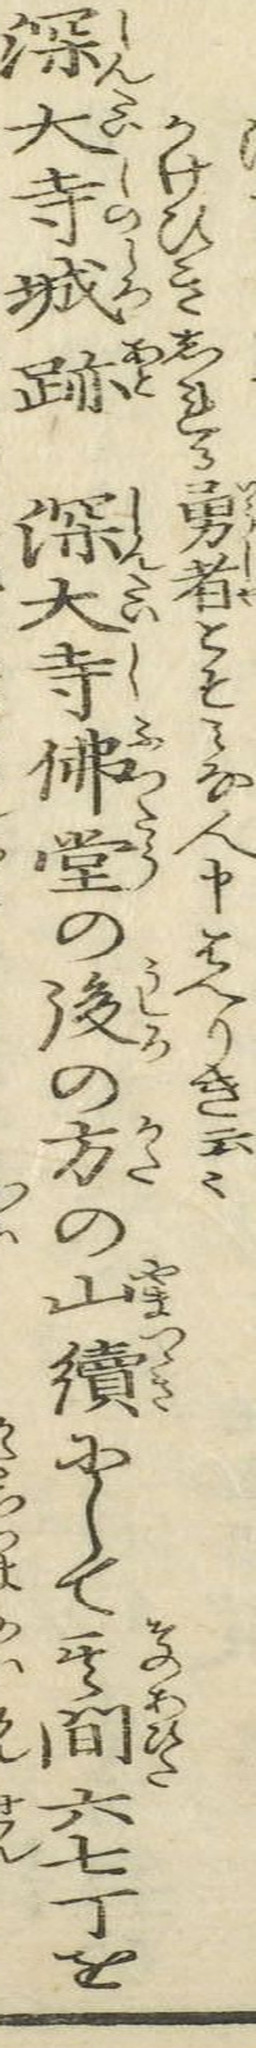深大寺城跡深大寺仏堂の後の方の山続にして其間六七丁を
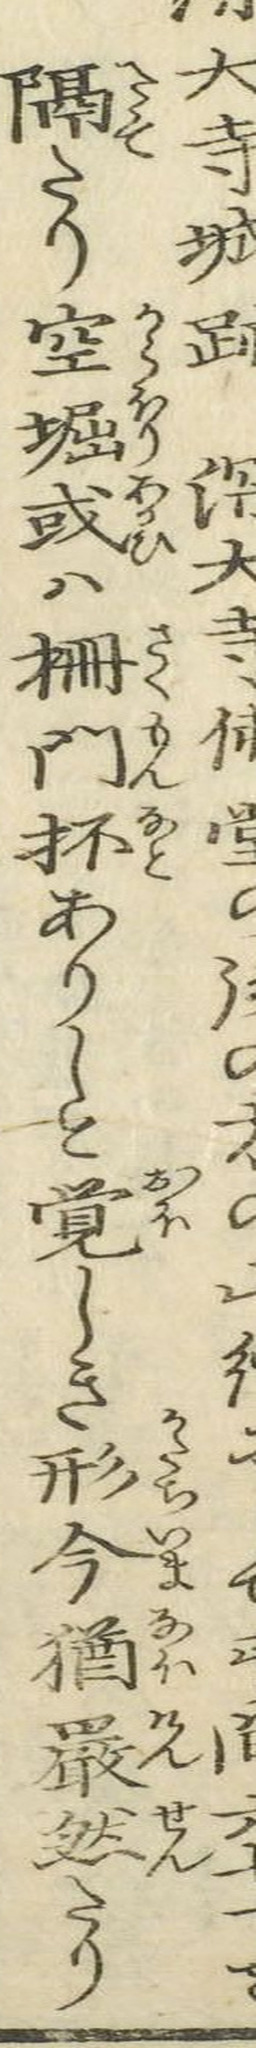隔たり空堀或は柵門抔ありしと覚しき形今猶厳然たり
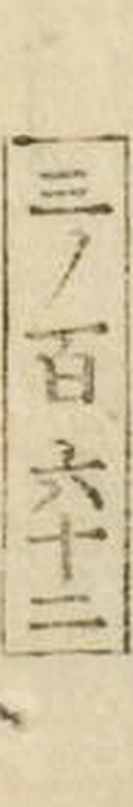三ノ百六十二
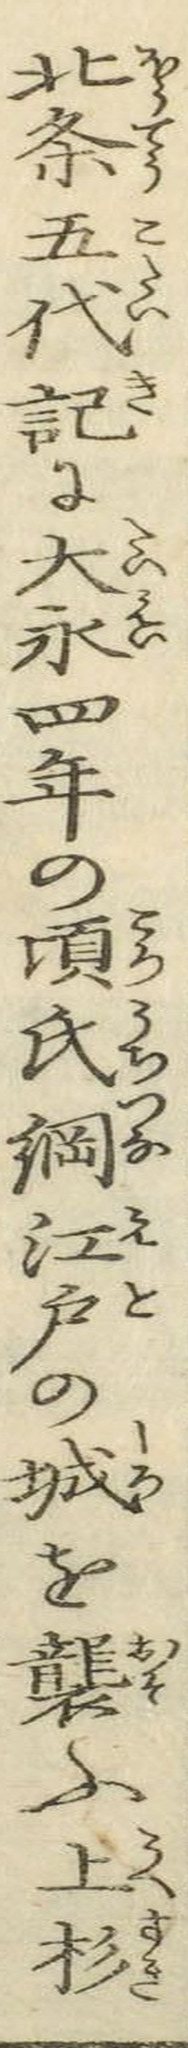北条五代記に大永四年の頃氏綱江戸の城を襲ふ上杉
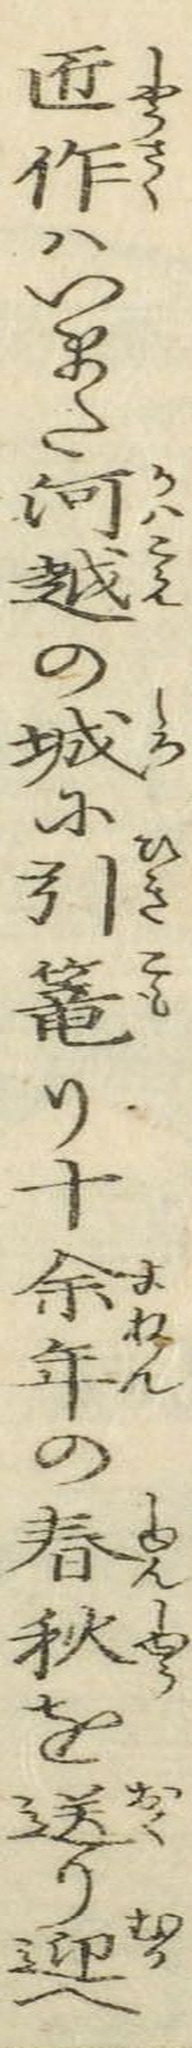匠作はいまた河越の城に引篭り十余年の春秋を送り迎へ
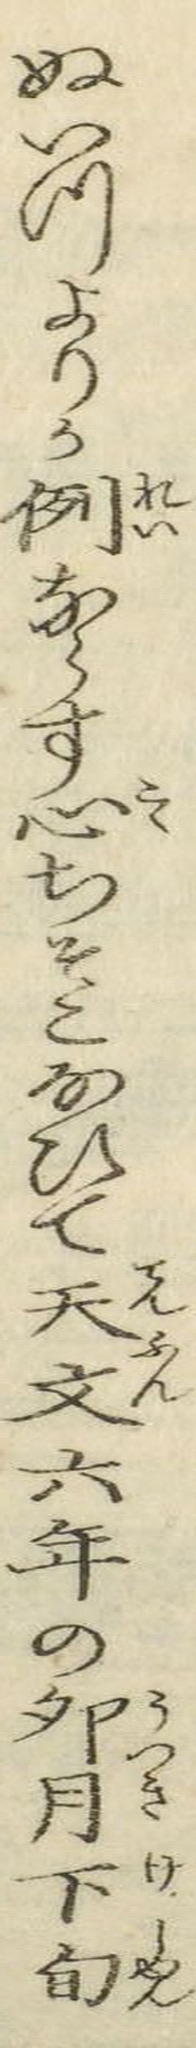ぬいつよりか例ならす心ちそこなひて天文六年の卯月下旬
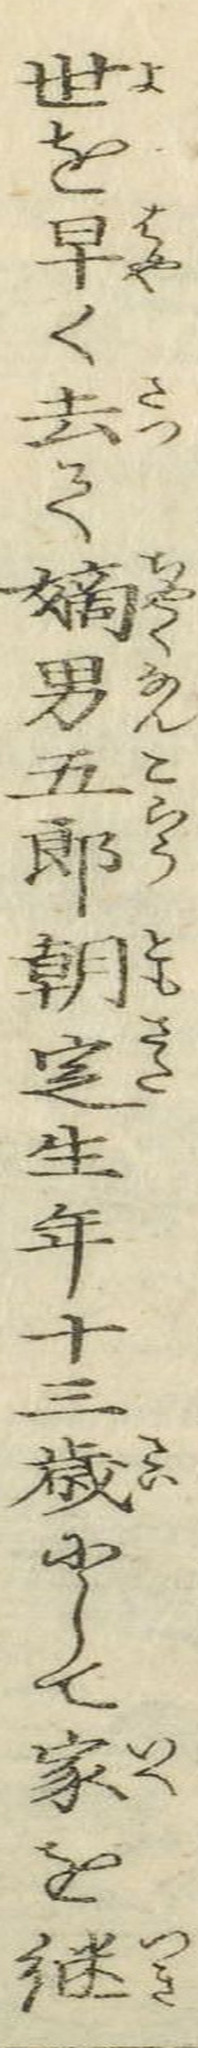世を早く去て嫡男五郎朝定生年十三歳にして家を継
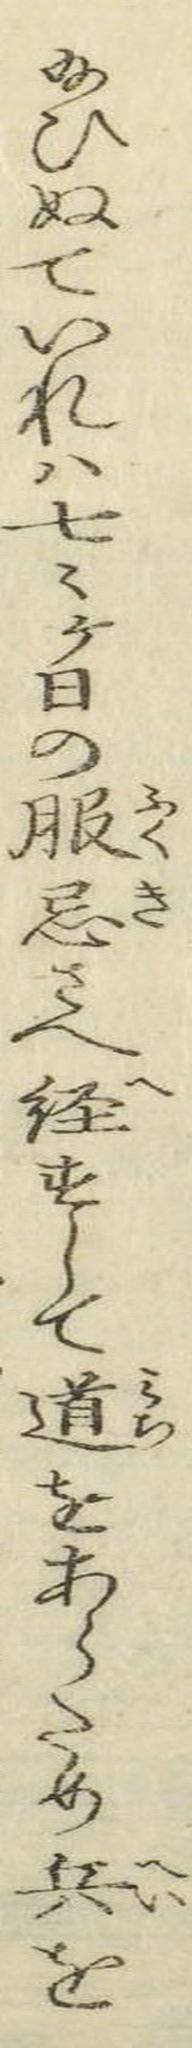給ひぬていれは七々ヶ日の服忌さへ経すして道をあらため兵を
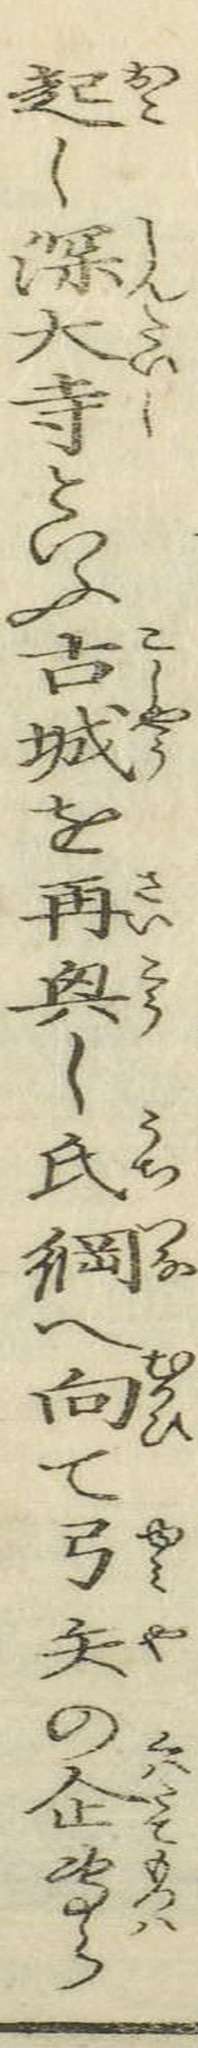起し深大寺といふ古城を再興し氏綱へ向て弓矢の企専ら
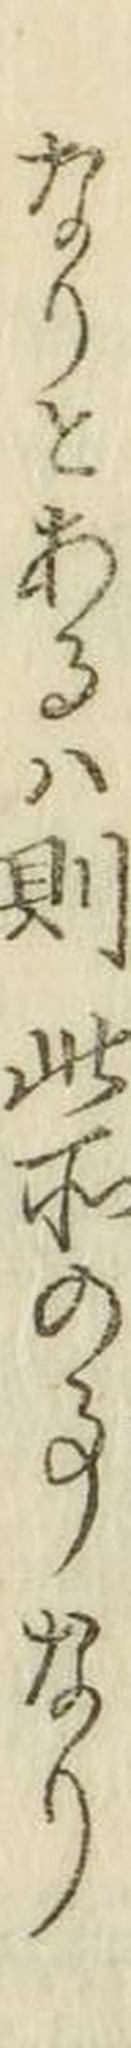なりとあるは則此所の事なり
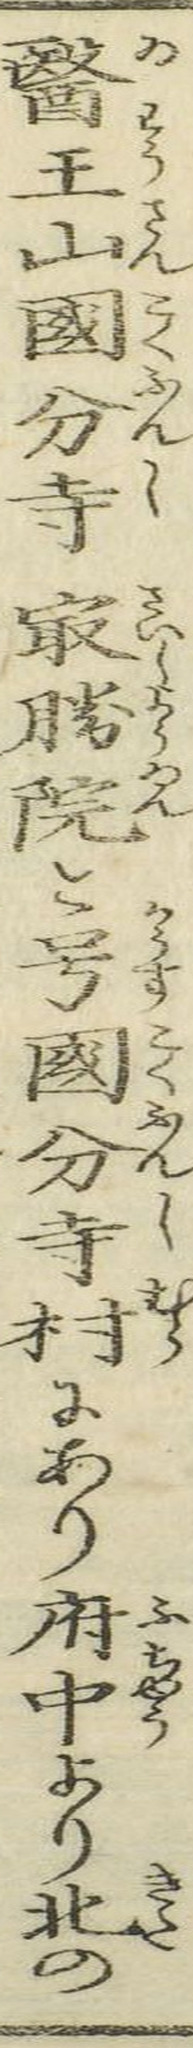医王山国分寺最勝院と号国分寺村にあり府中より北の
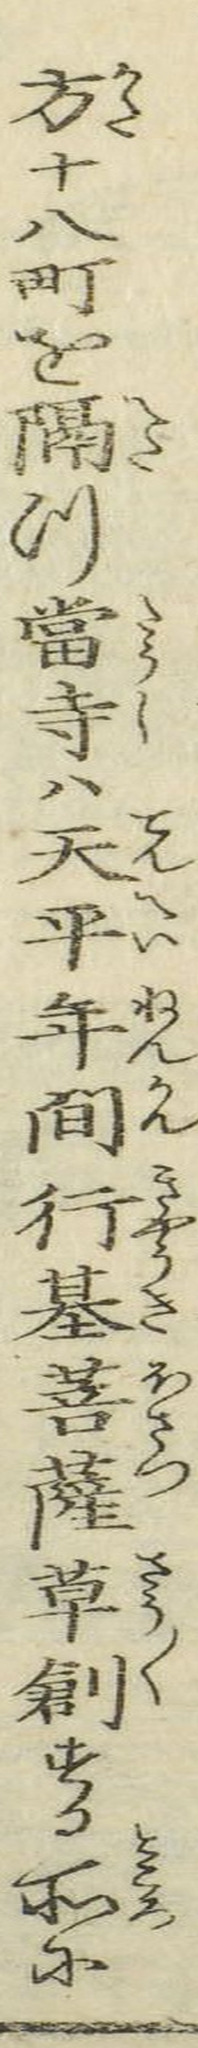方十八町を隔つ当寺は天平年間行基菩薩草創する所に
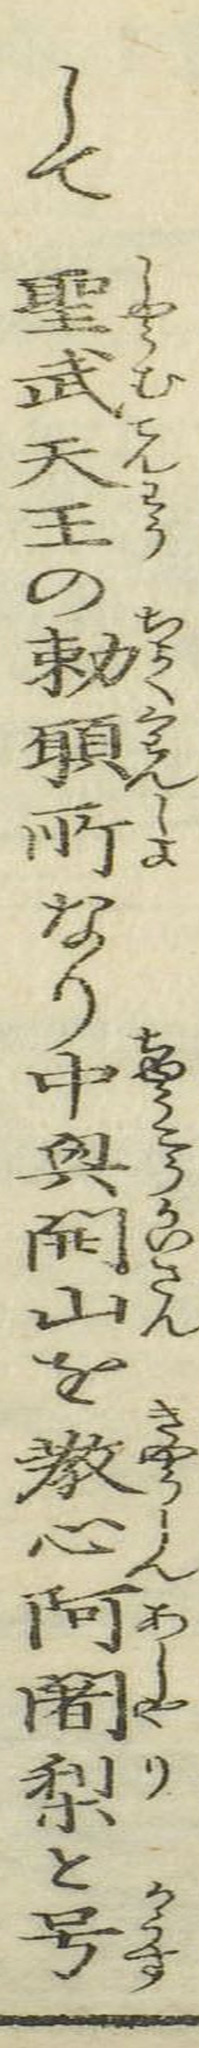して聖武天皇の勅願所なり中開山興を教心阿闍梨と号
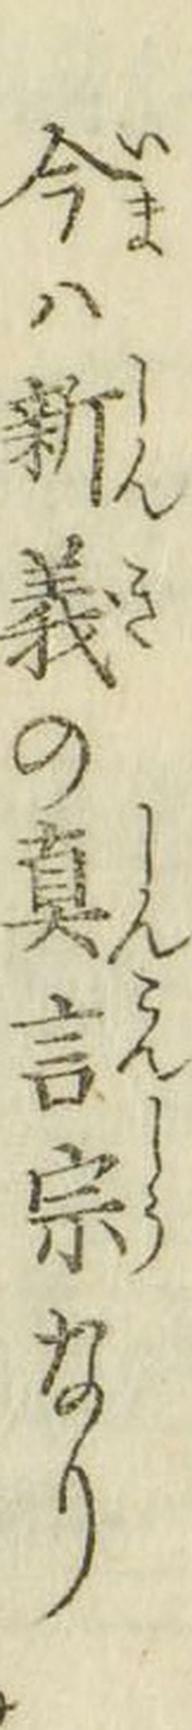今は新義の真言宗なり

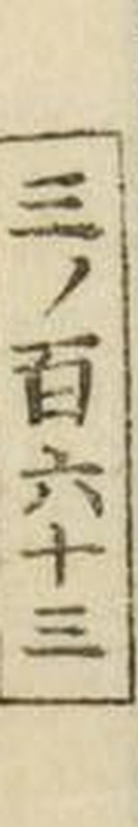三ノ百六十三
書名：江戸名所図会 20巻 巻之9
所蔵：東京学芸大学教育コンテンツアーカイブ
